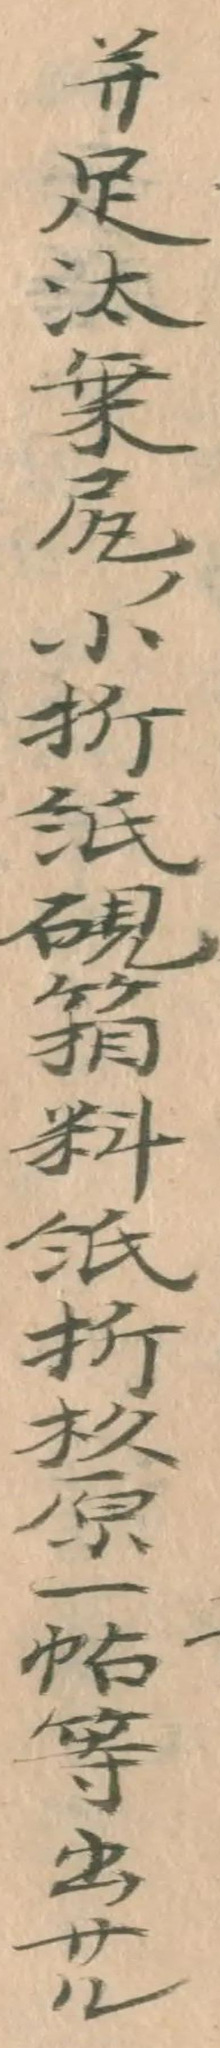幷足汰乗尻ノ小折紙硯箱料紙折杦原一帖等出サル
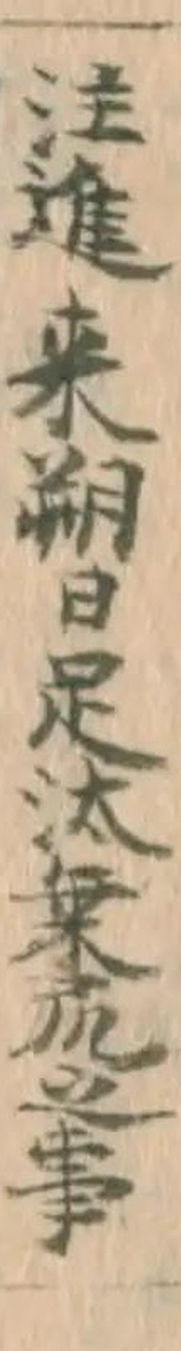注進来朔日足汰乗尻之事
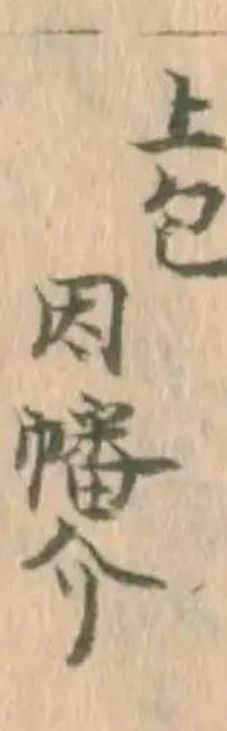因幡介
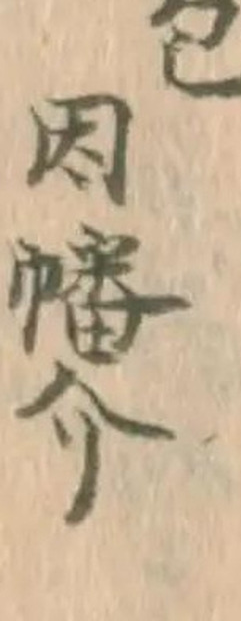因幡介
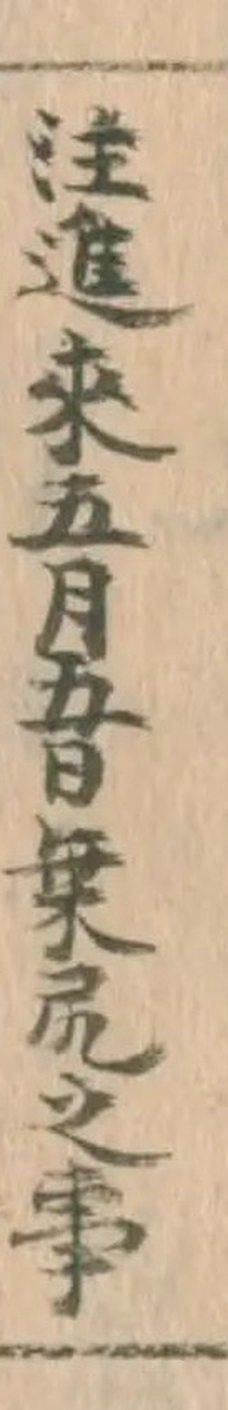注進来五月五日乗尻之事
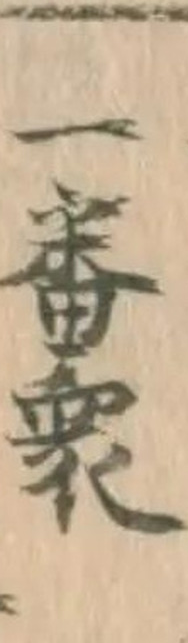一番衆
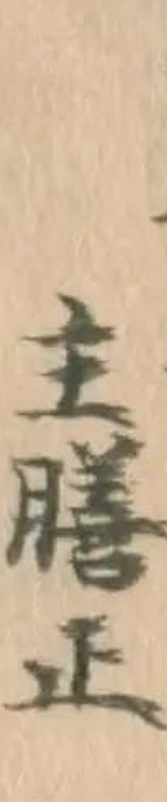主膳正
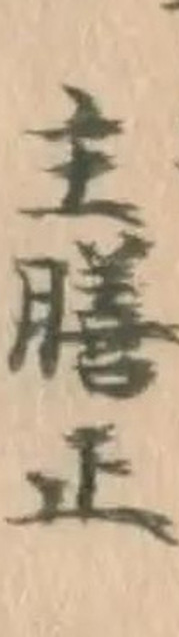主膳正
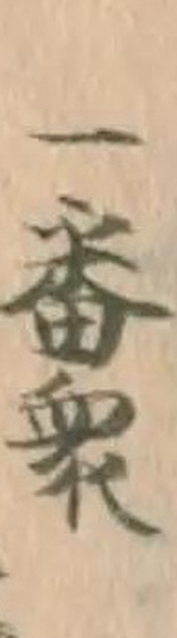一番衆
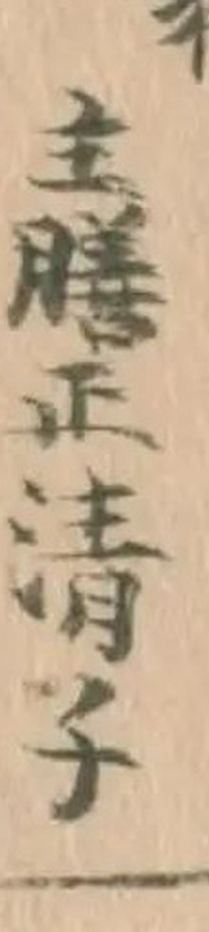主膳正清子
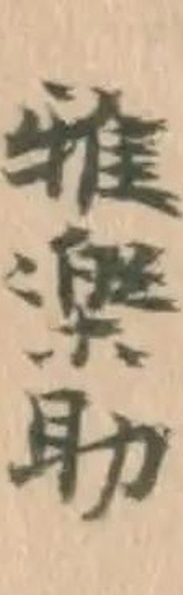雅楽助
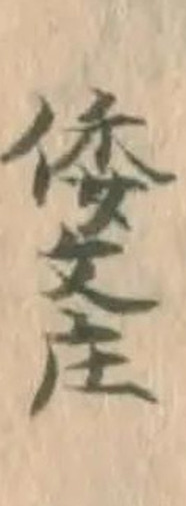倭文庄
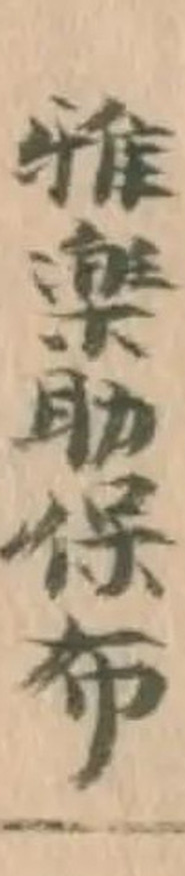雅楽助保布
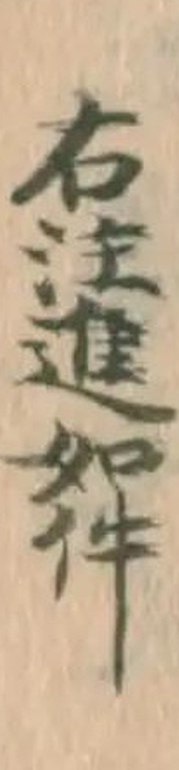右注進如件
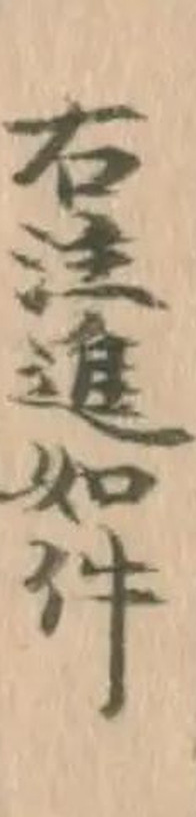右注進如件
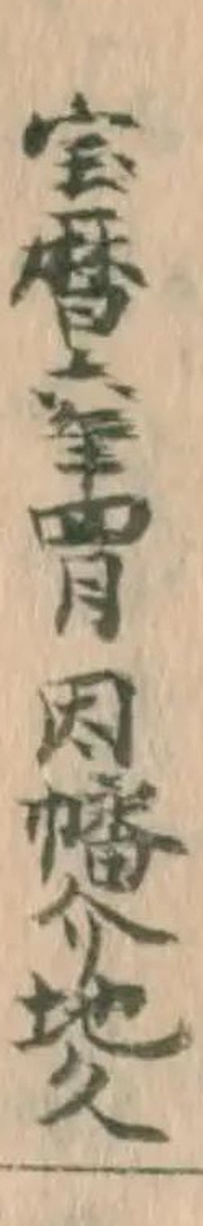宝暦六年四月因幡介地久
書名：賀茂社記録. 第40冊
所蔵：国立国会図書館 National Diet Library, JAPAN
